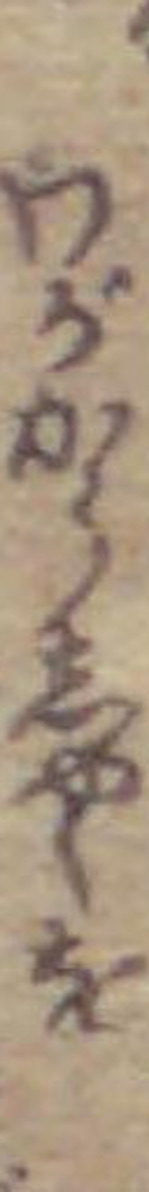わがかうしやくを

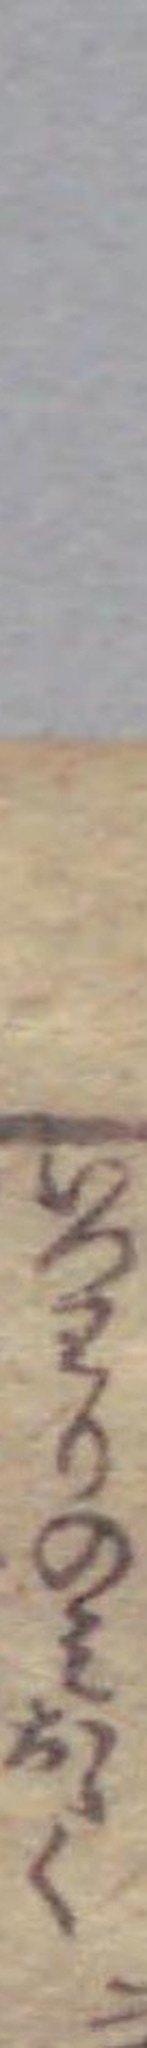いつわりのみおゝく
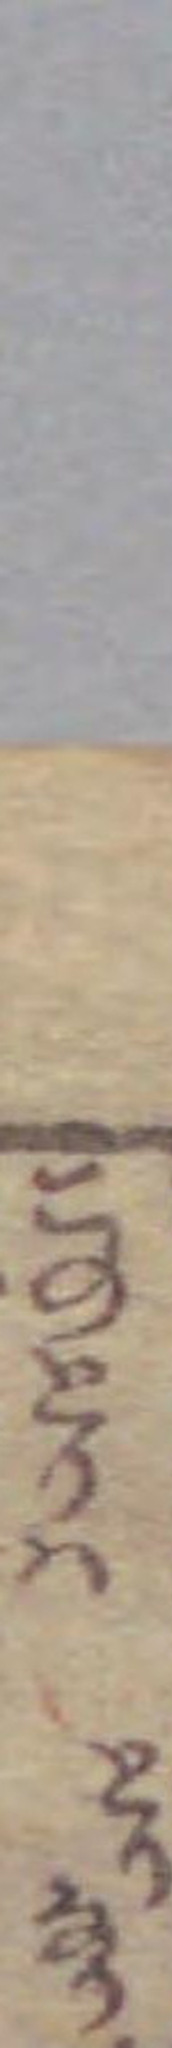このとりは
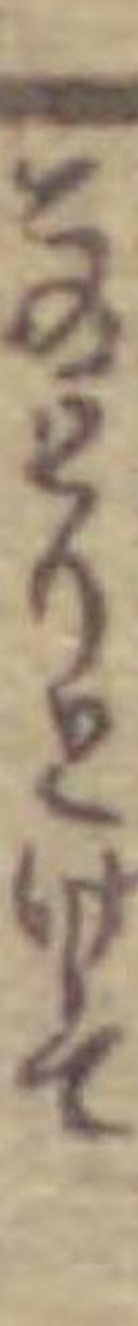このとりとけして
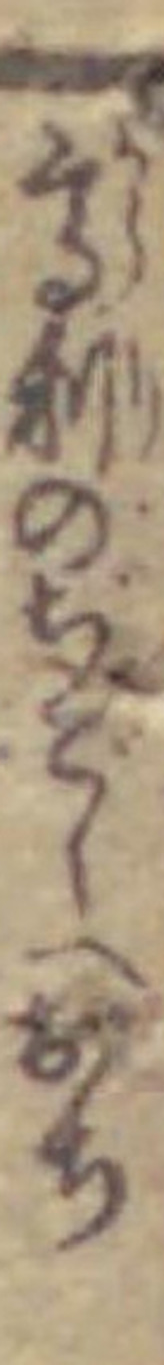高利のぢごくへおち
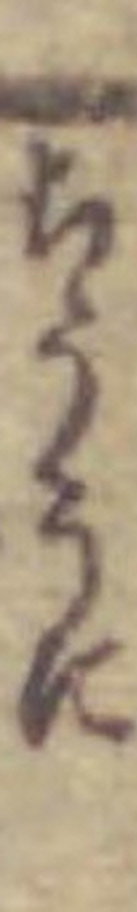ちううに
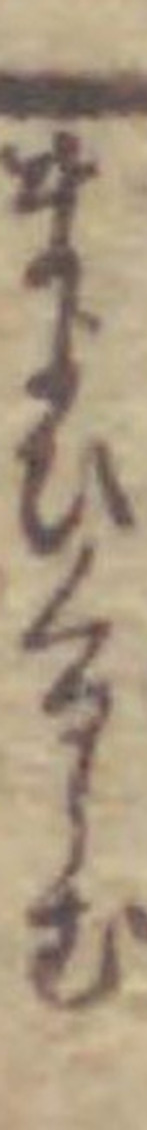まよひくるしむ
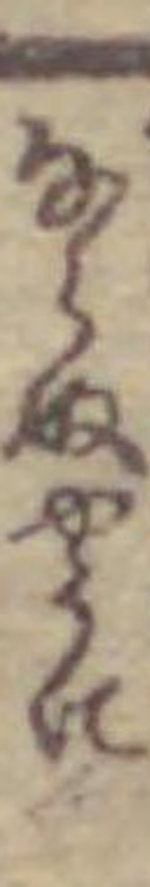ならぬやうに
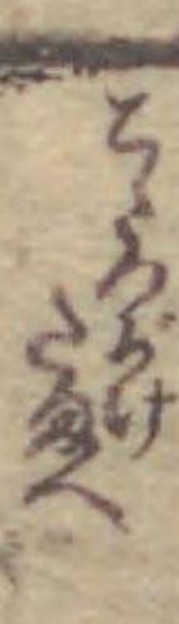こゝろがけ
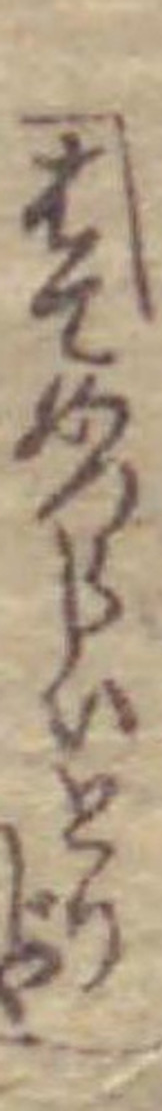〽はてめつらしいとりじや
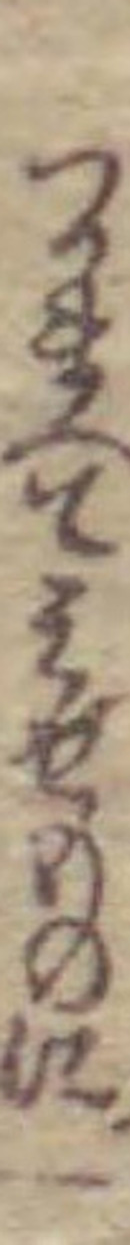つかまへてみせものに
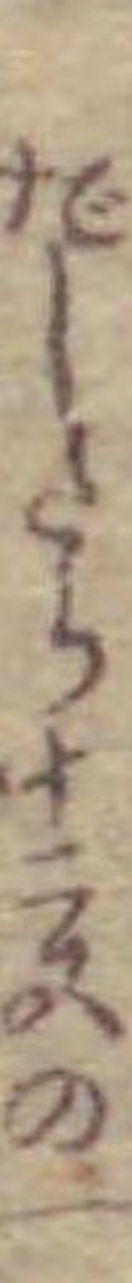だしたら十二文の
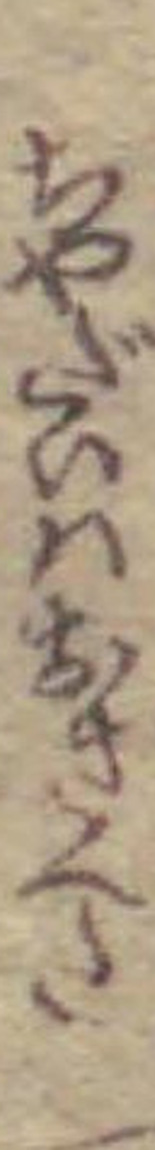ちゃだいはおさへた

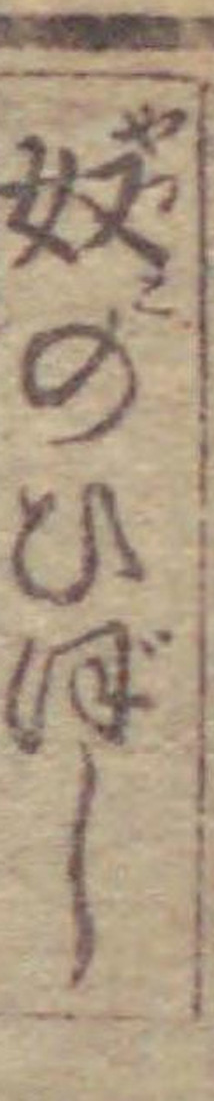奴のひぼし
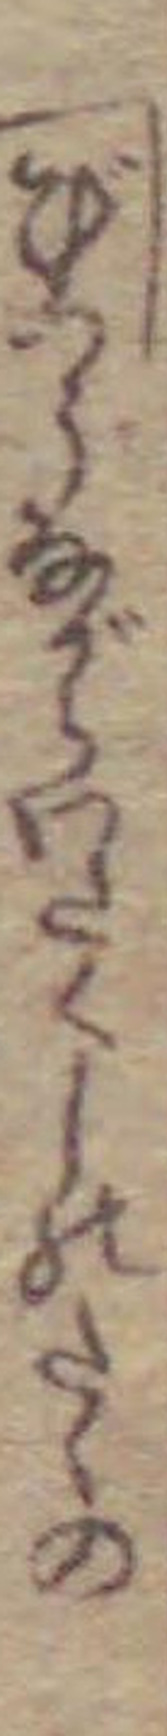〽びろうながらわたくしのたくの
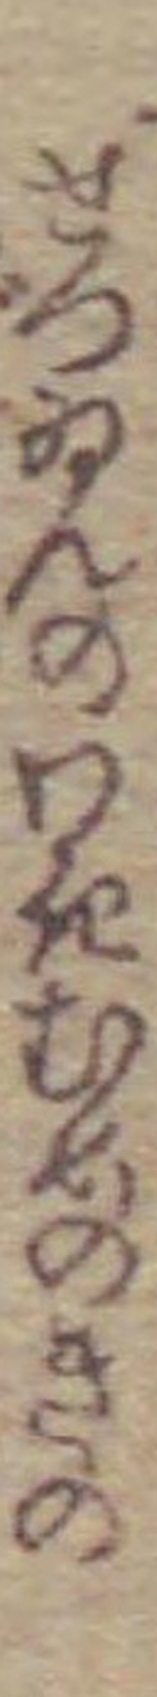せつゐんのわきむめのきの
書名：化物和本草 : 3巻
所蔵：国立国会図書館 National Diet Library, JAPAN
